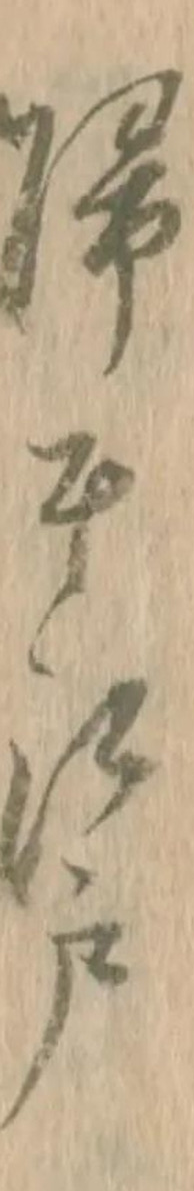帰候江戸
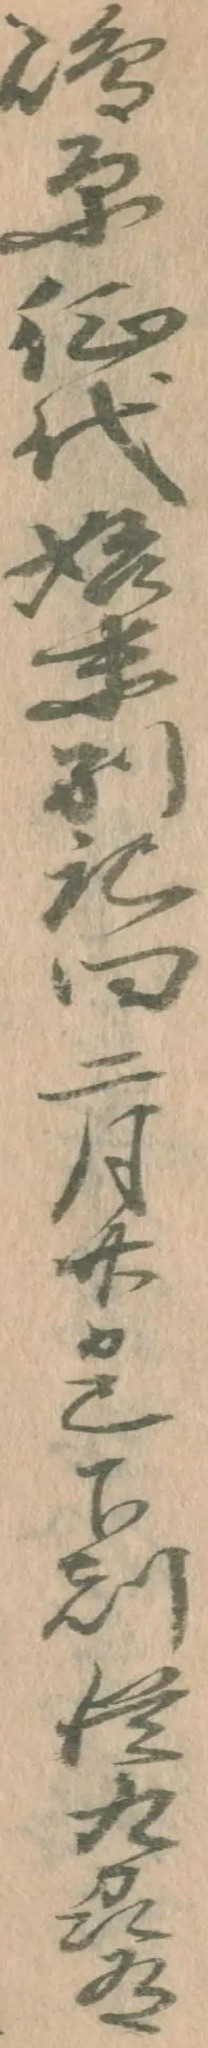島原征伐始末別記曰二月廿日巳下刻従九州有
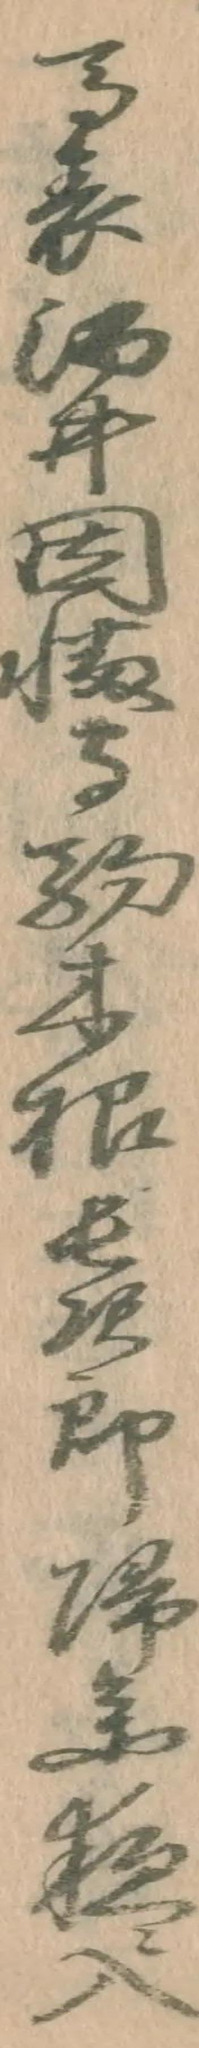馬表酒井因幡守駒木根長次郎帰参夜に入
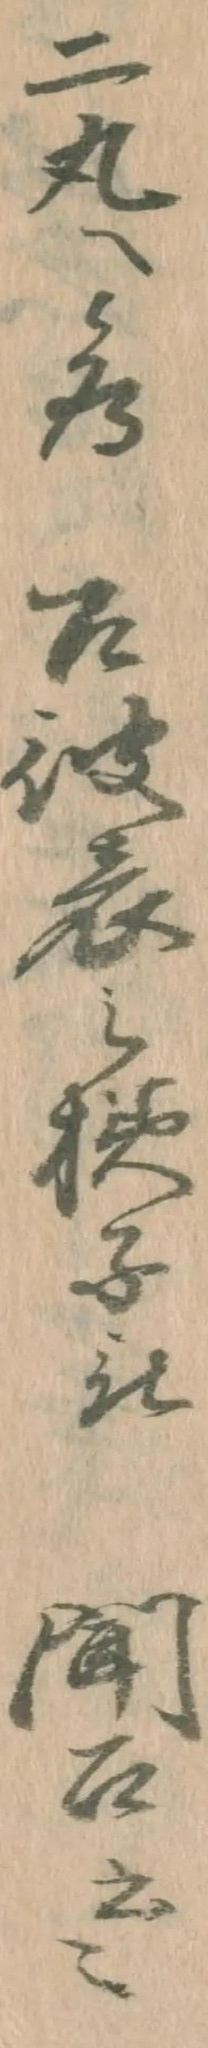二丸へ被為召彼表之様子被聞召之也
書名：切支丹御退治記 49巻. [6]
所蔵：国立国会図書館 National Diet Library, JAPAN
